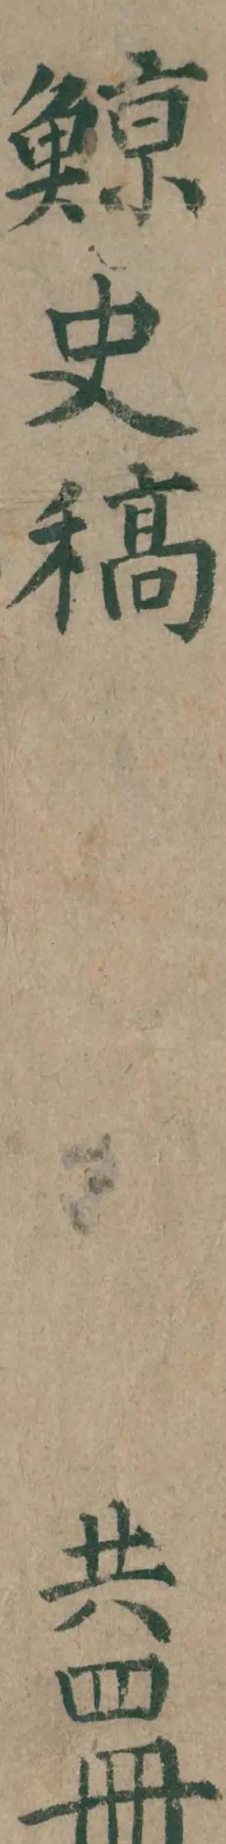鯨史稿共四冊

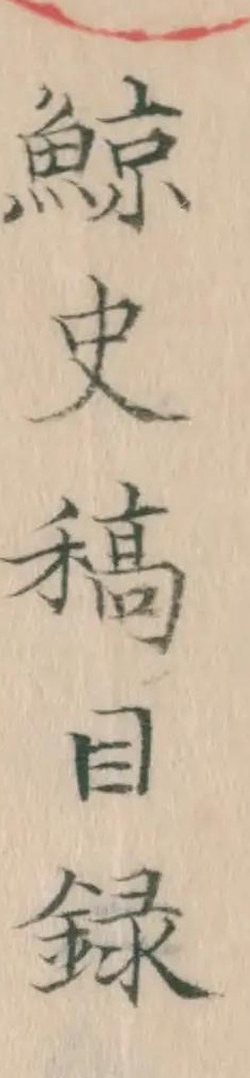鯨史稿目録
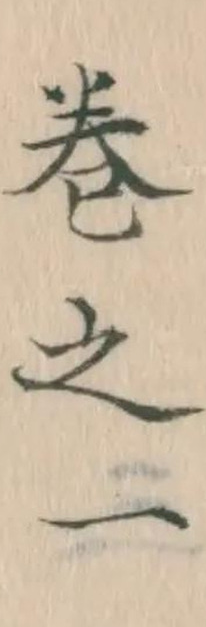巻之一
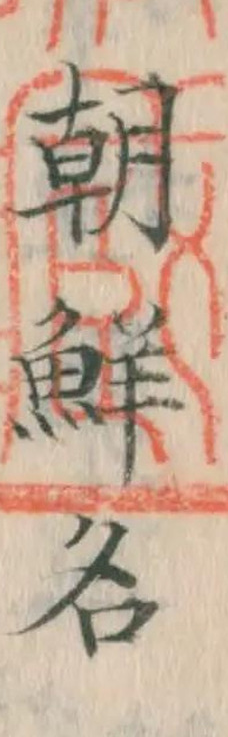朝鮮名
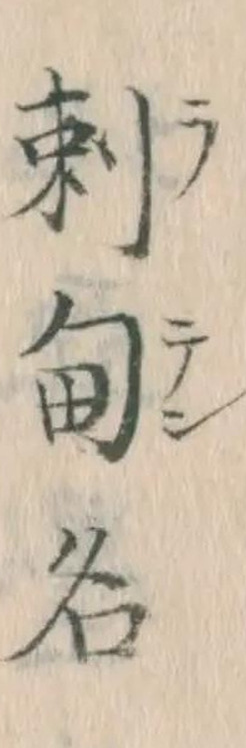剌甸名
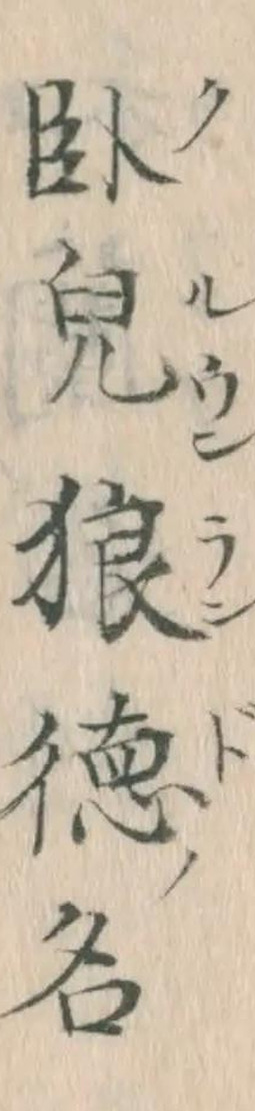卧兒狼徳名
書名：鯨史稿 6巻. [1]
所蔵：国立国会図書館 National Diet Library, JAPAN
